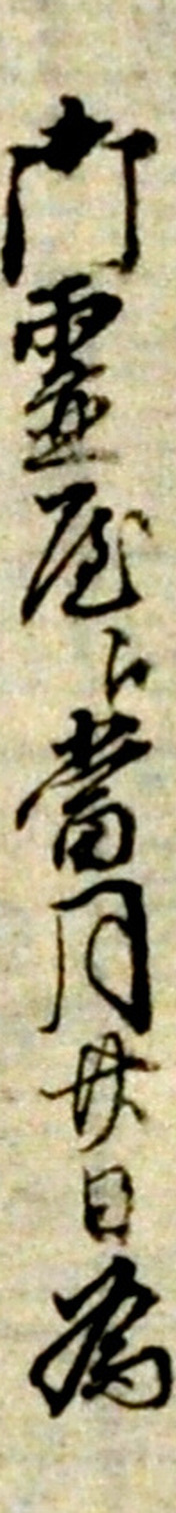御霊屋江当月廿日為
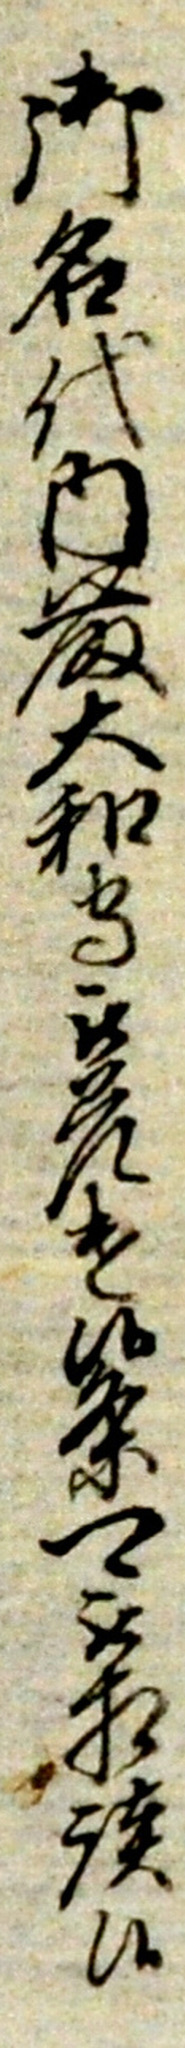御名代内藤大和守被差遣候条可被相談候
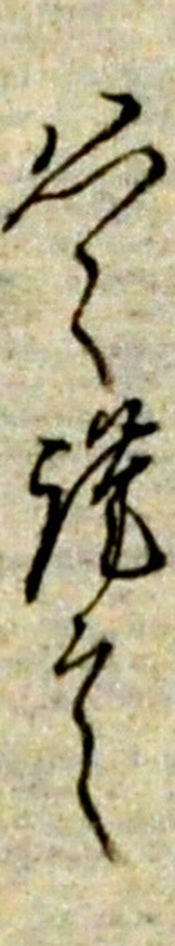恐々謹言
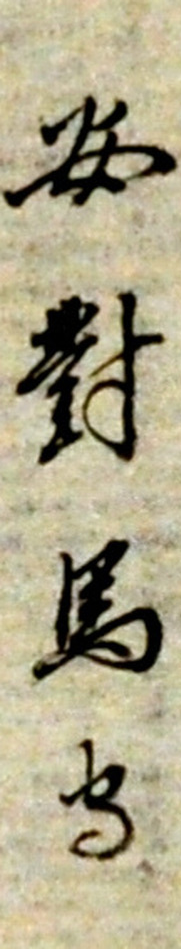安対馬守
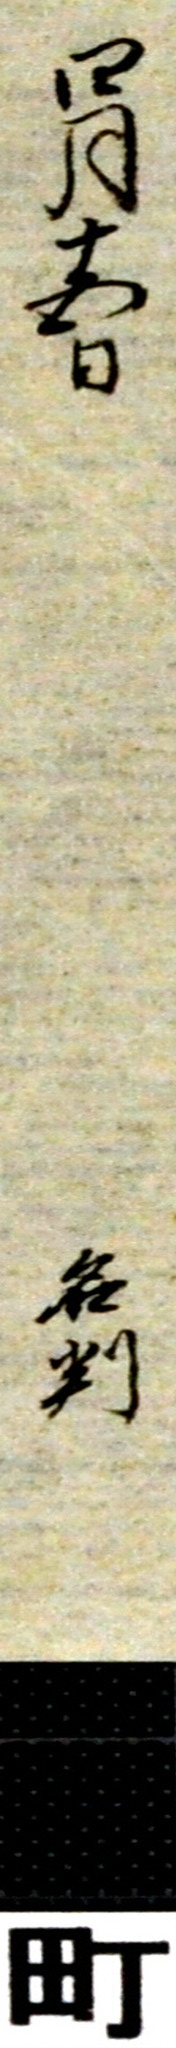四月十五日名判
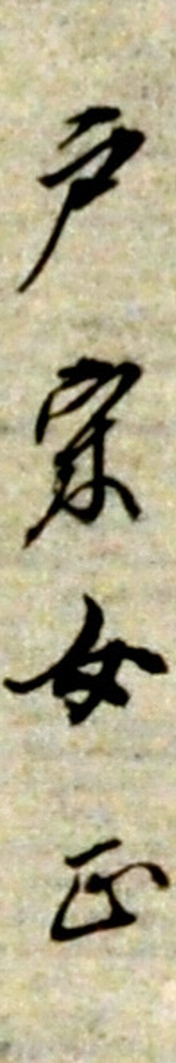戸采女正
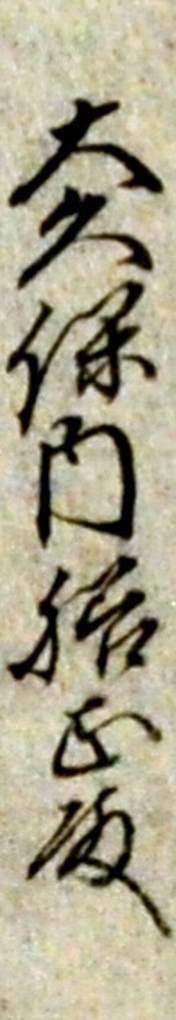大久保内膳正殿
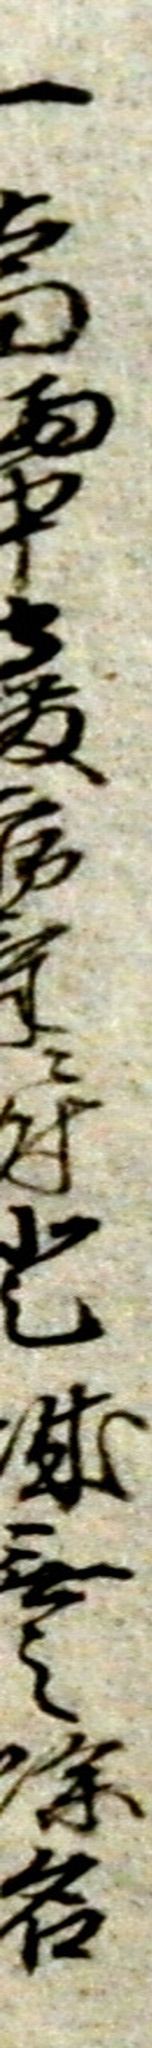一太田備中守殿病気ニ付登城無之除名

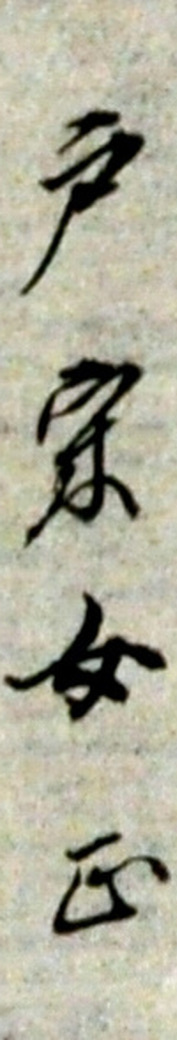戸采女正
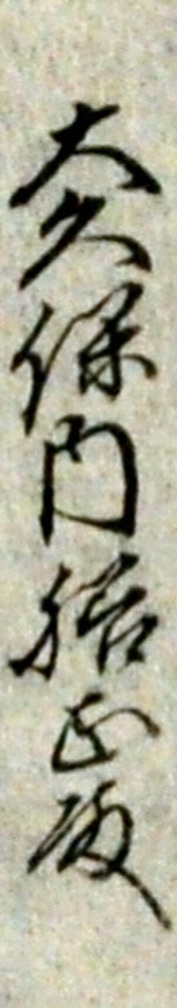大久保内膳正殿
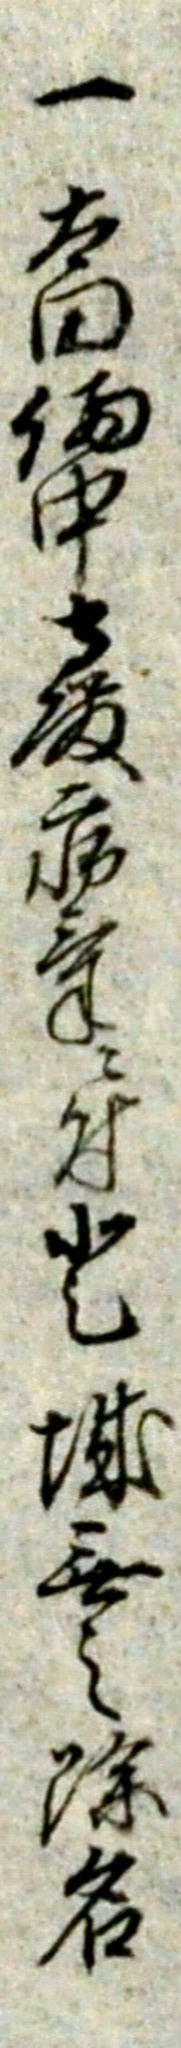一太田備中守殿病気に付登城無之除名
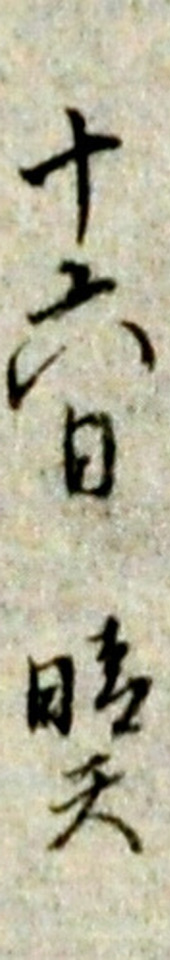十六日晴天
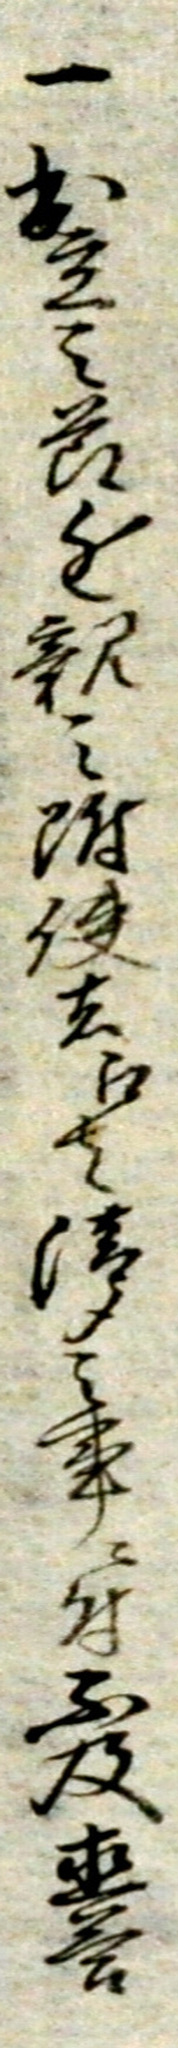一出立之節近親之附使者江者清メ之事ニ付不及直答
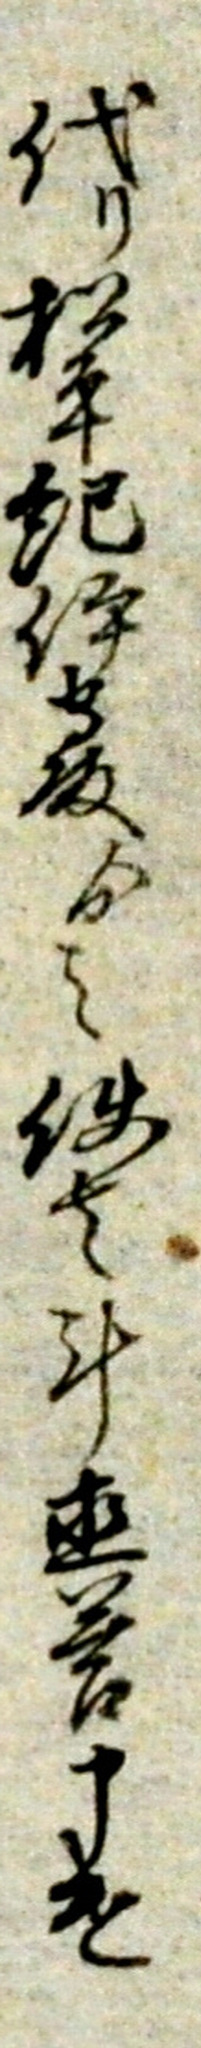代り松平紀伊守殿ゟ之使者計直答申遣
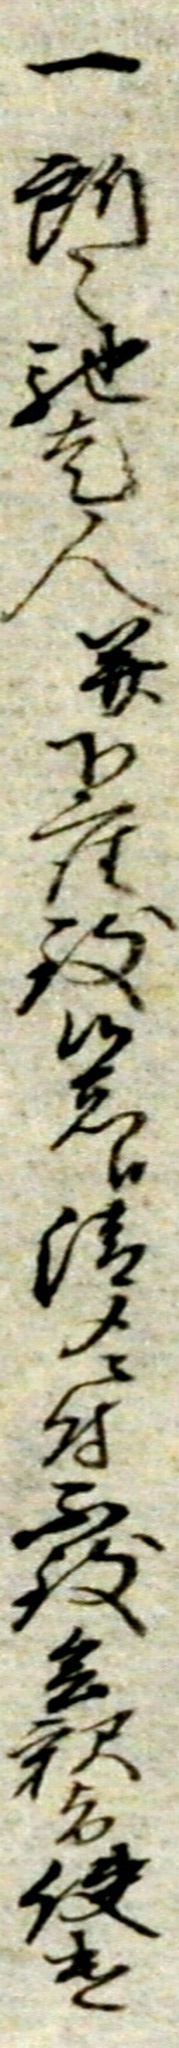一所々馳走人幷下座致候者江清メニ付不致会釈
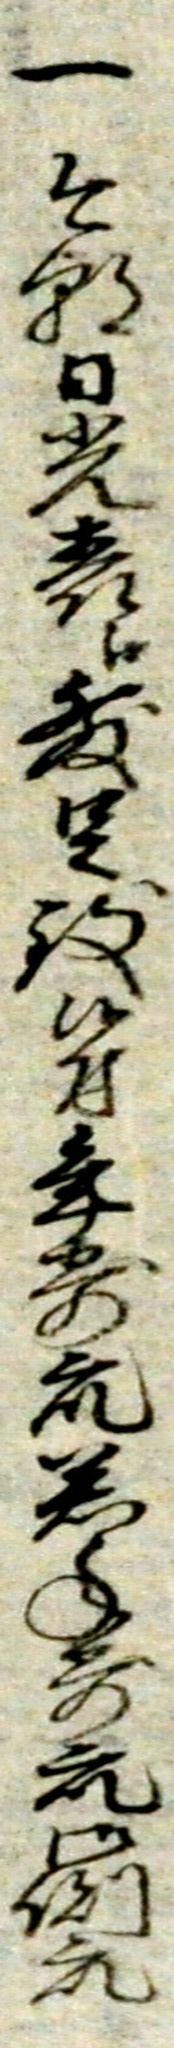一今朝日光表江敷足致候付年寄衆若年寄衆御側衆
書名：日光御名代相勤候節ノ留
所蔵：伊那市立高遠町図書館・合同会社AMANE
